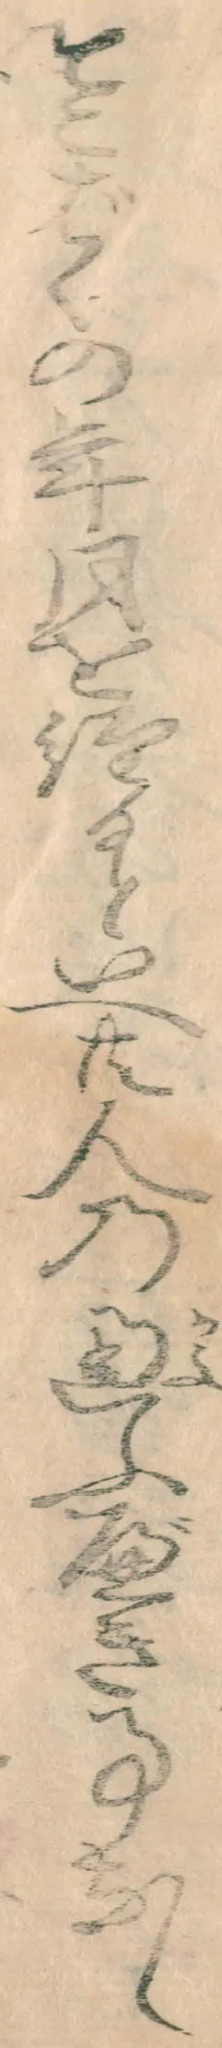そこばくの年月を経るといへ共人の通ふべき事なし
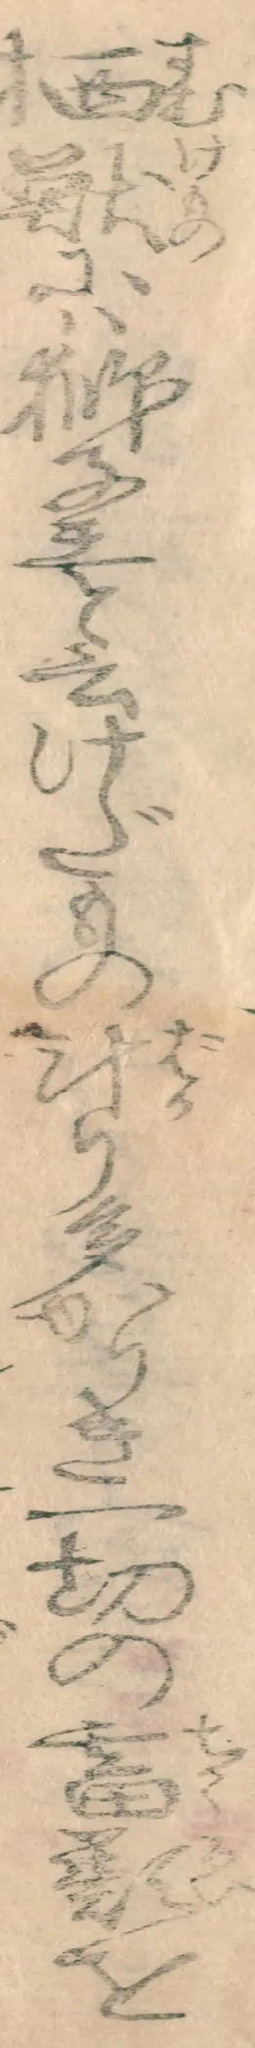栖獣には獅子王と云けだもの計り多かりき一切の畜類を
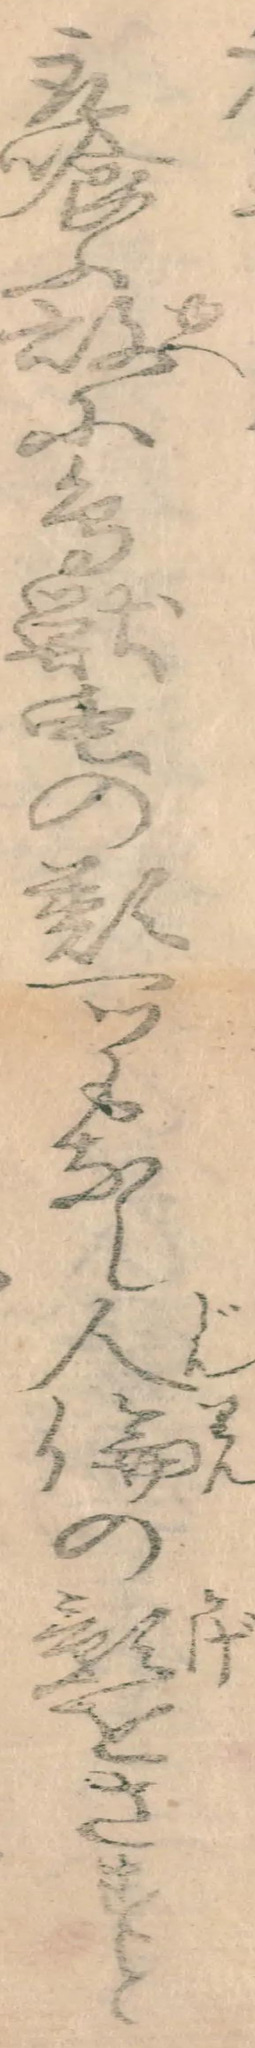取喰ふ故に鳥獣虫の類一ッもなし人倫の影をさすと
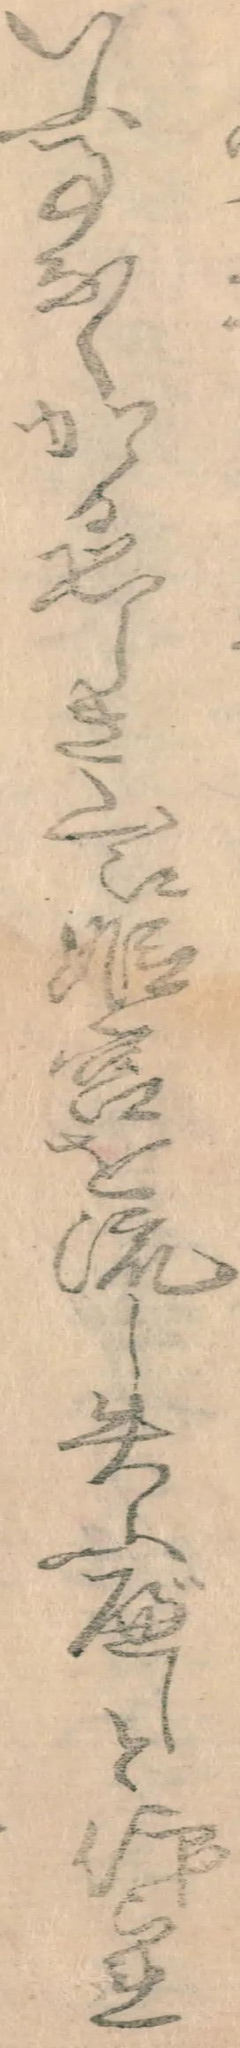いふ事なくかゝる恐しき山え姫宮を流し失ふべしと仰られ
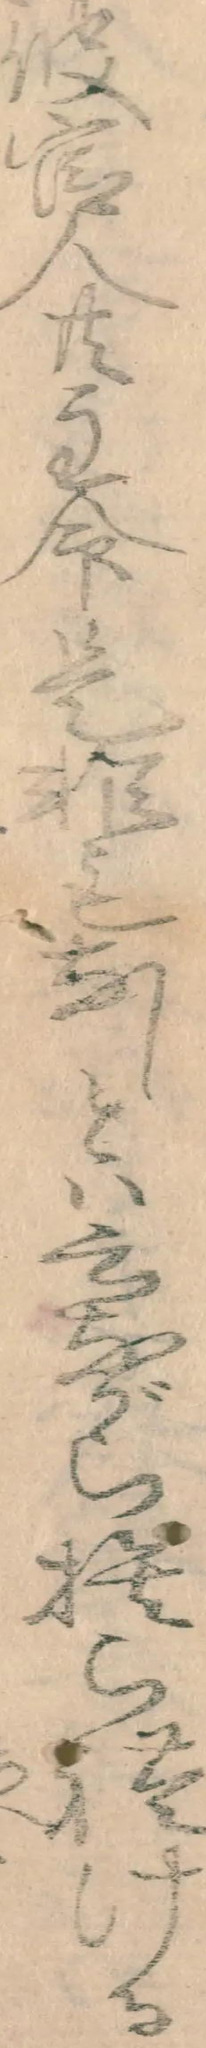彼官人共主命是非もなしとは云ながら捨られける
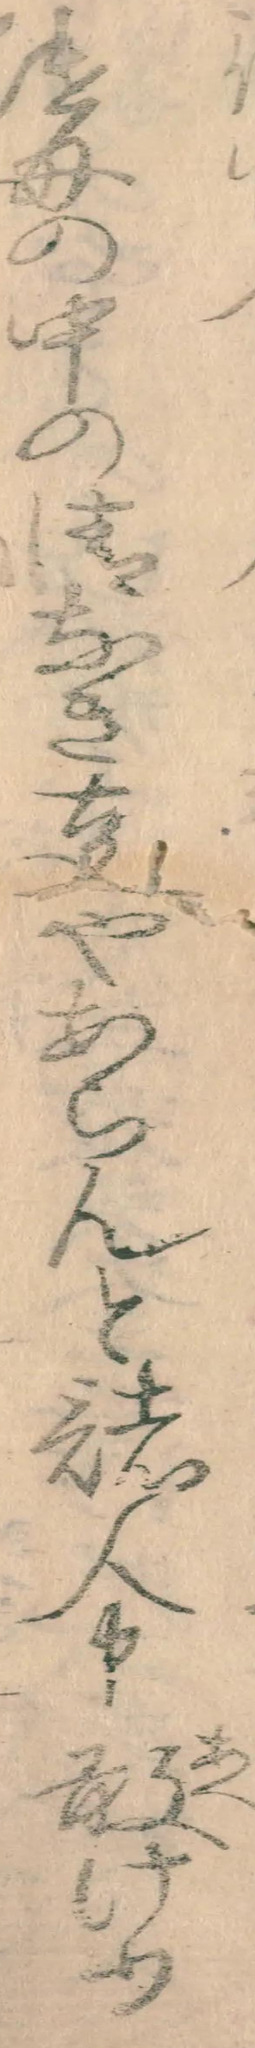継母の中の情なき事やあらんと諸人申敢けり
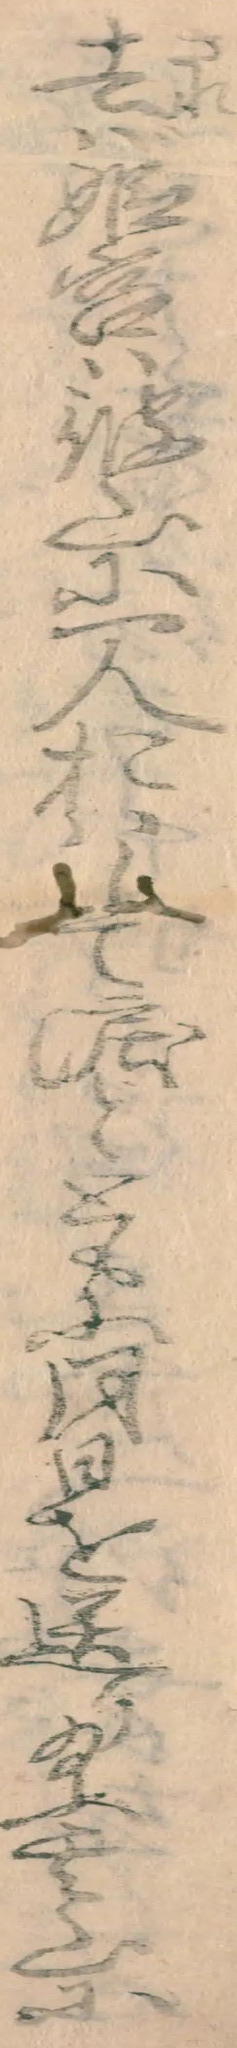去ば姫宮は彼山に一人おはして涙とともに月日を送り給ふ其山に
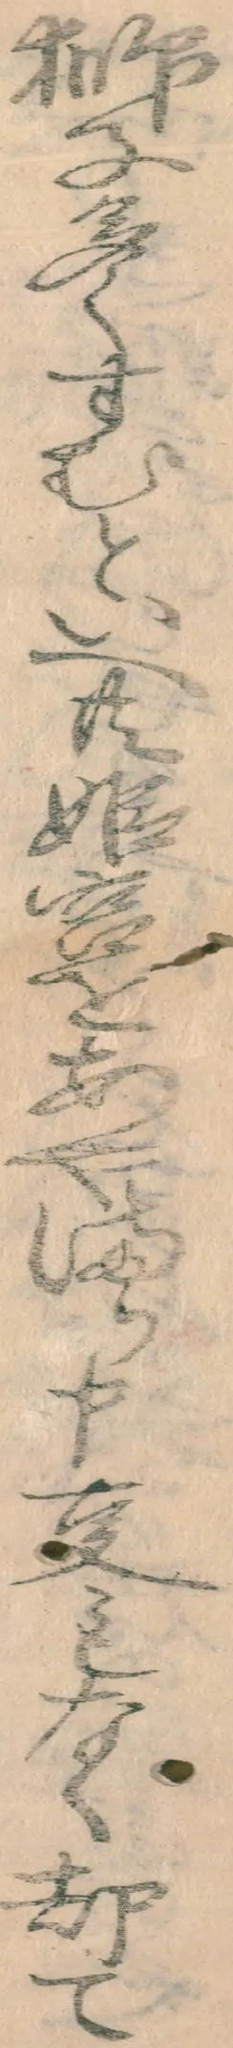獅子多くすむといへ共姫宮をあやまり申事もなく却て
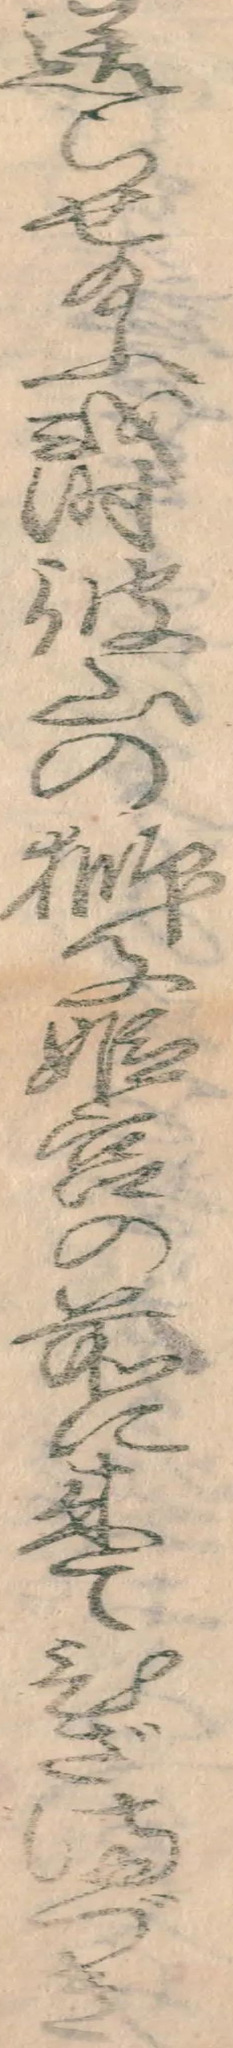送らせ給ふ或時彼山の獅子姫宮の前に来てひざまづき
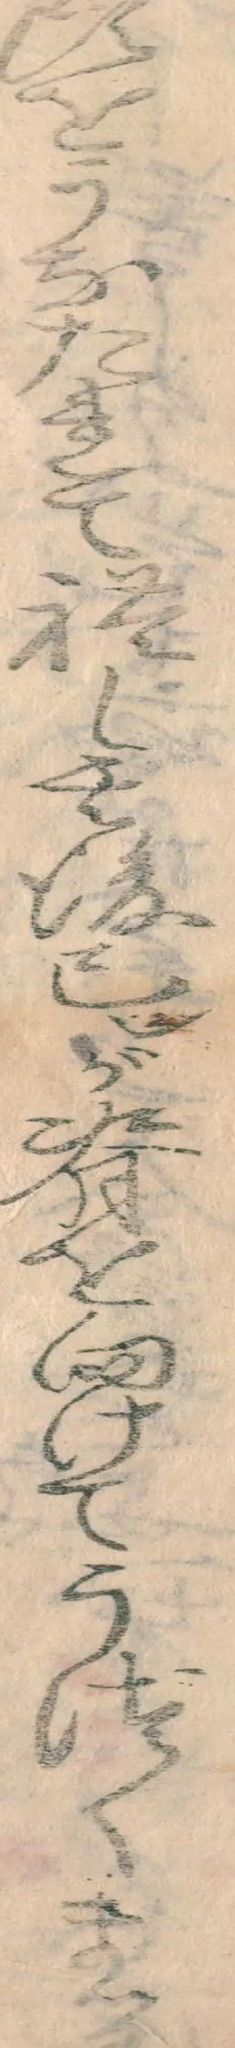頭をうなたれて礼し其後己れがせ脊を向けてうづくまる
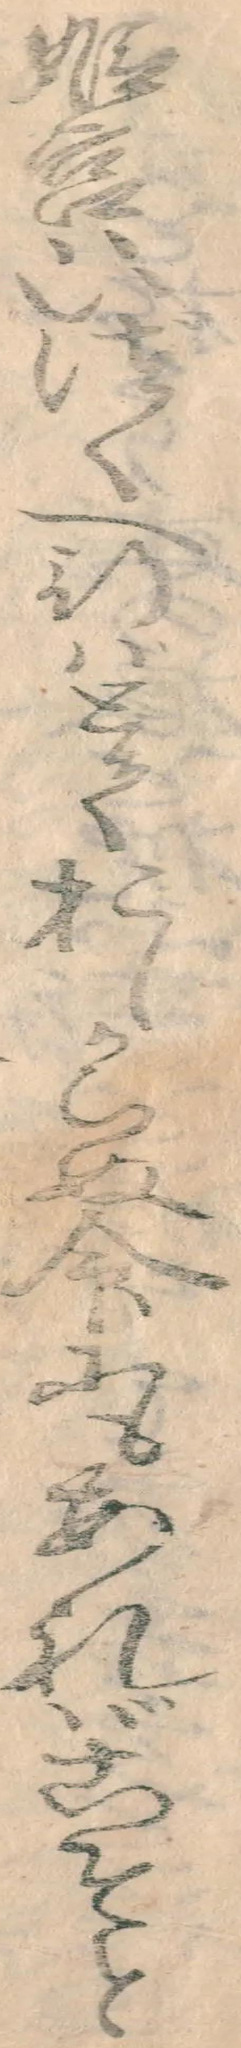姫宮はいづくへ行はとておしからぬ命にもあればこそと
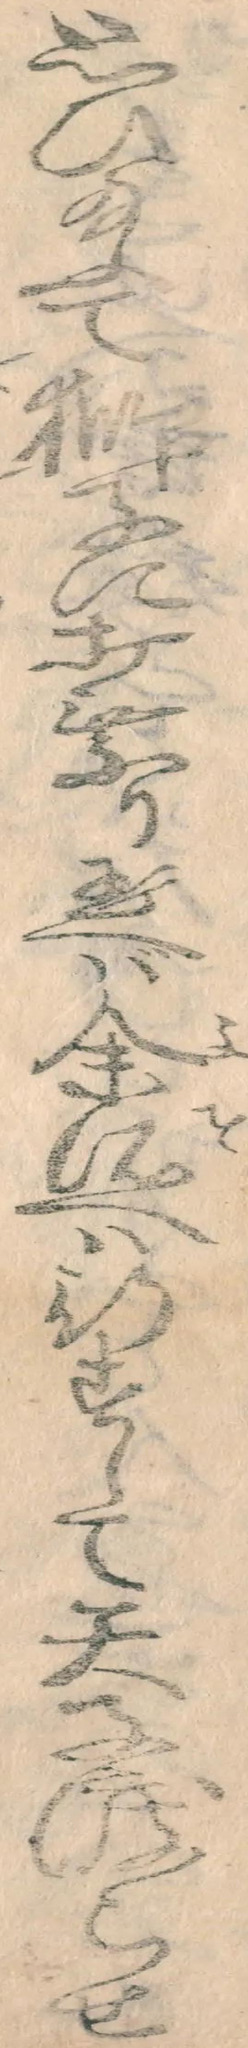思ひ給ふて獅子に打乗り玉へば余所へは行すして天子渡らせ
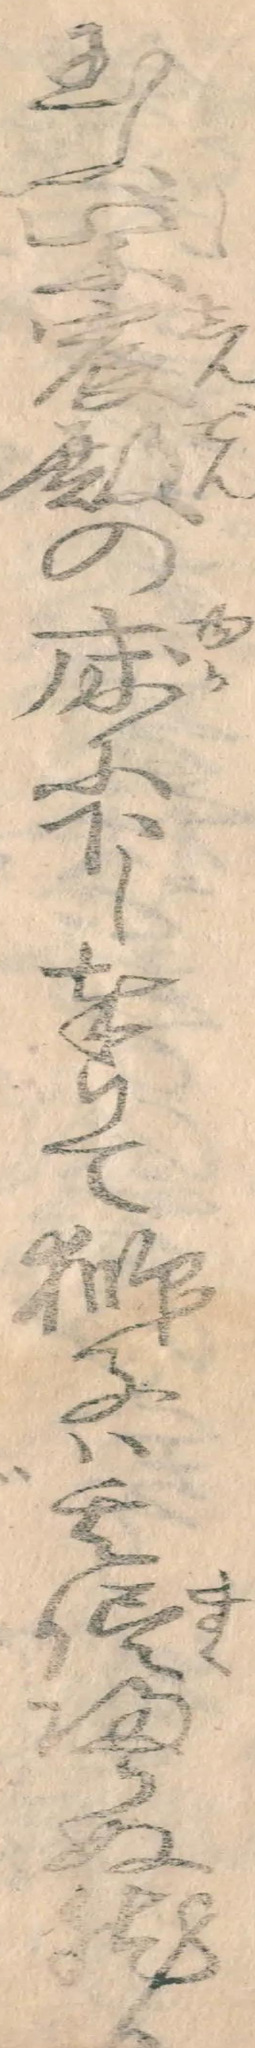玉ふ紫宸殿の床に下し奉りて獅子は其侭帰りぬ然る
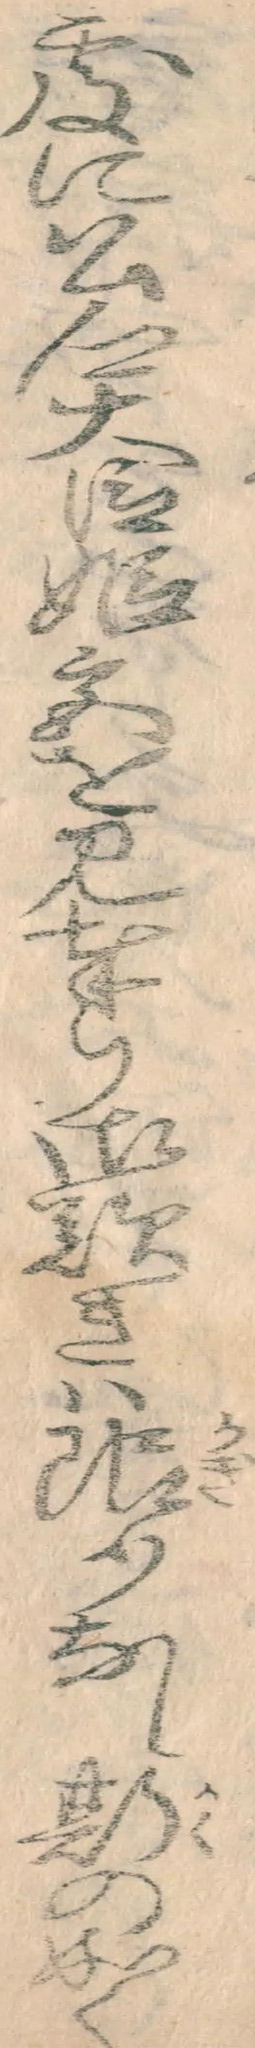處に公卿大臣姫宮を見奉り御歎きは限りなし斯の如く
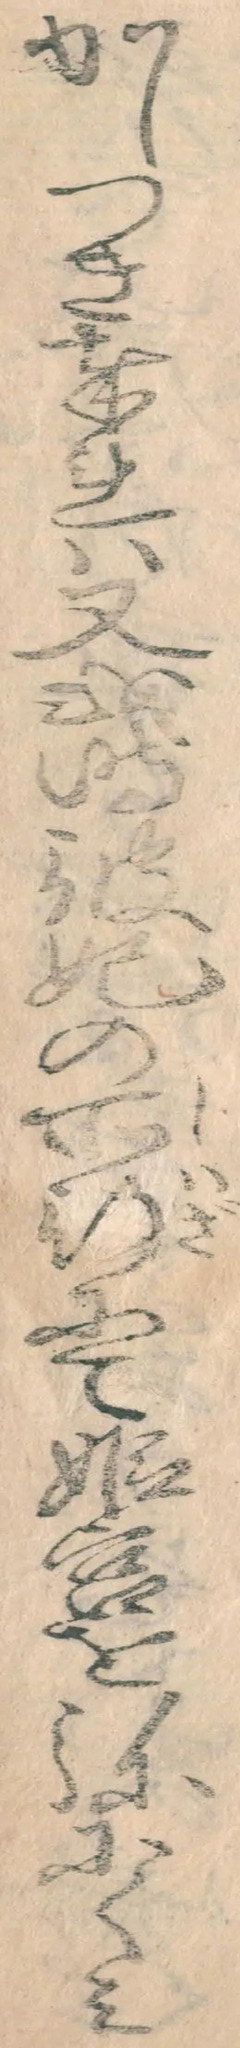かしつき奉れは又或時彼妃の所行にて姫宮を弥にくみ

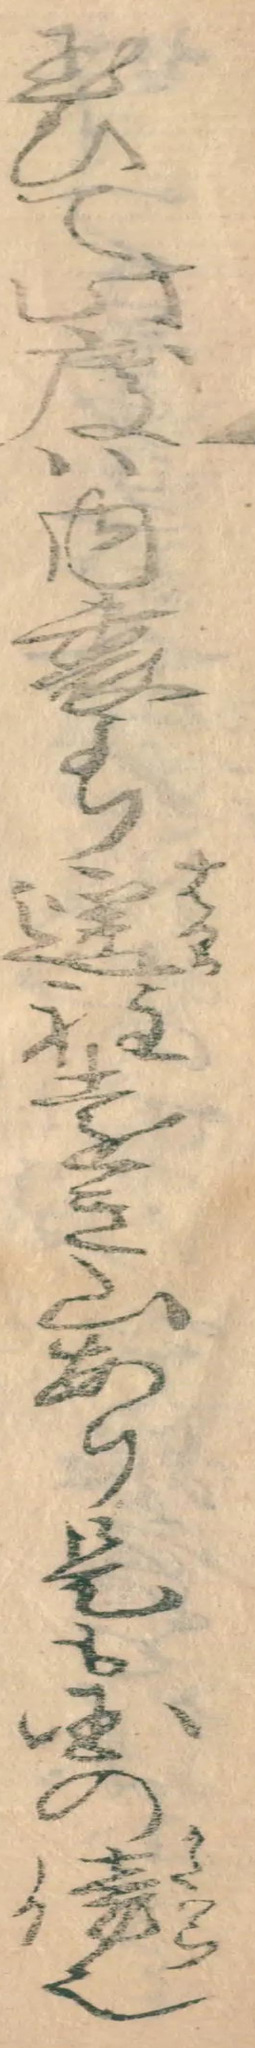玉ひて此度は内裏より遥程遠き山あり是も国の傍也
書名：蚕養御由来記
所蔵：国立国会図書館 National Diet Library, JAPAN
